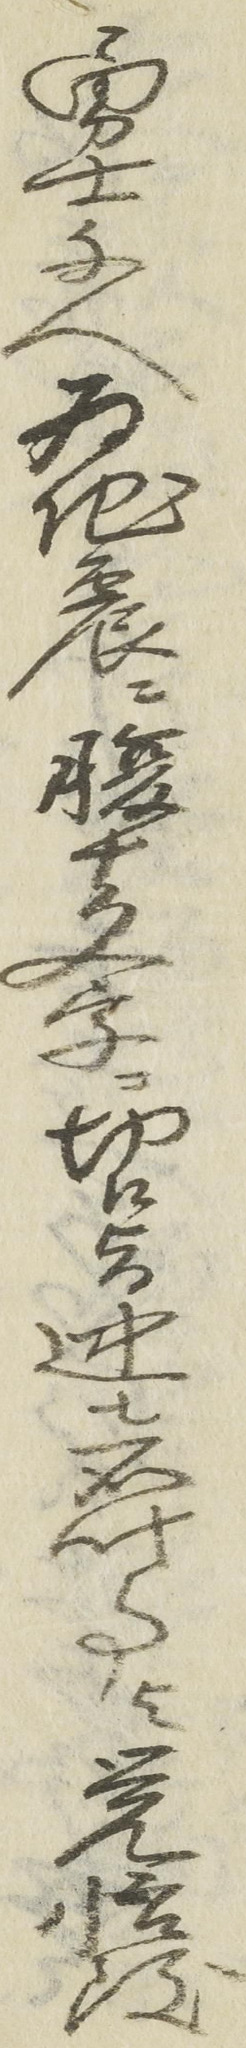勇士千人在為地震ニ腹十文字ニ切候旨迚も不叶事と覚悟致
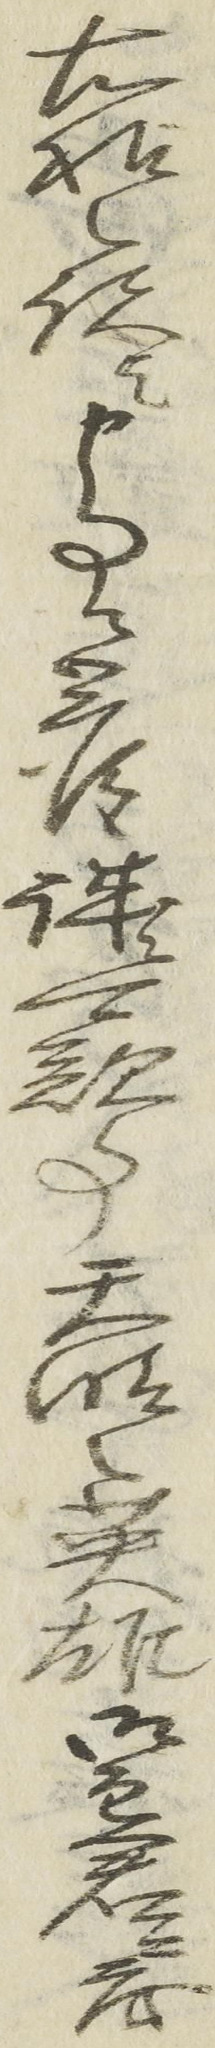右様之訳と申事ニ御座候誠ニ可歎事天晴之英雄御主君にも
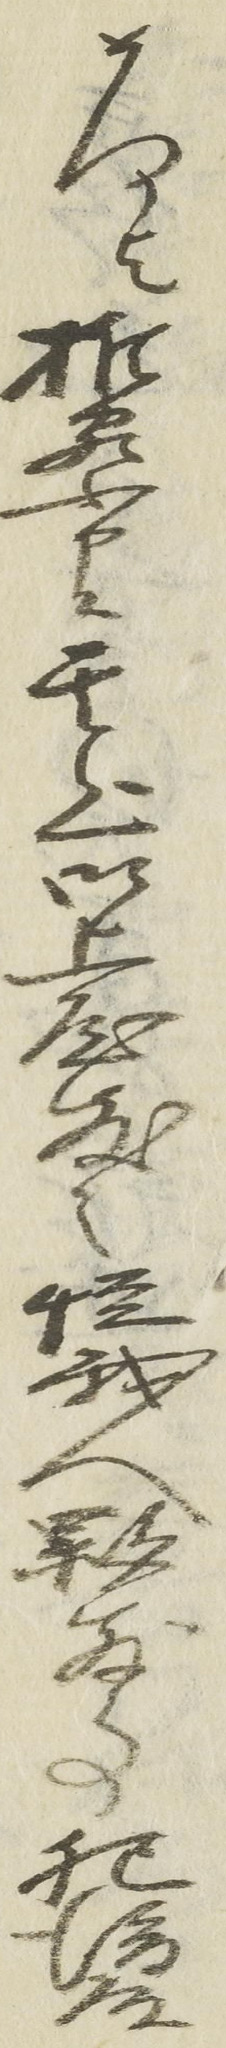如何と推察申候其上御上屋敷之怪我人夥敷事肥後殿
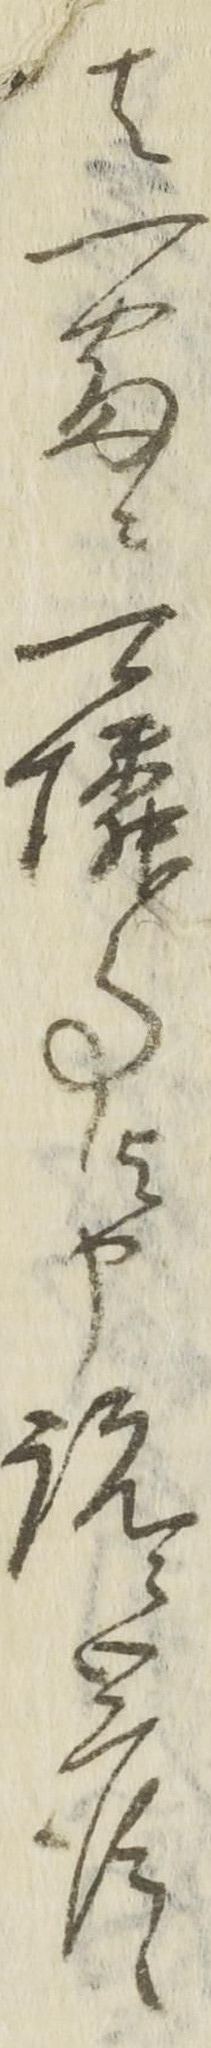は一番ニ可憐事と申説ニ御座候
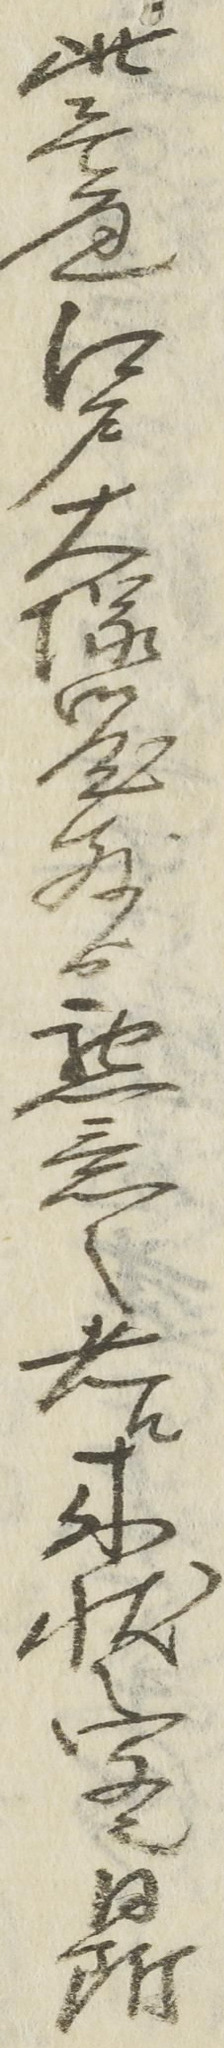此壱通江戸大塚御屋敷ゟ懇意之者江来状之写シ日附
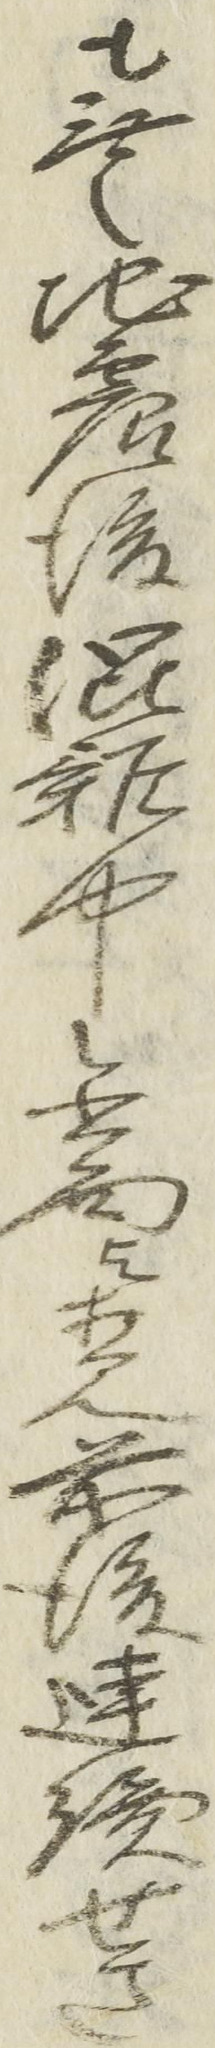も無之地震後混雑中之書面と相見前後連続せさ
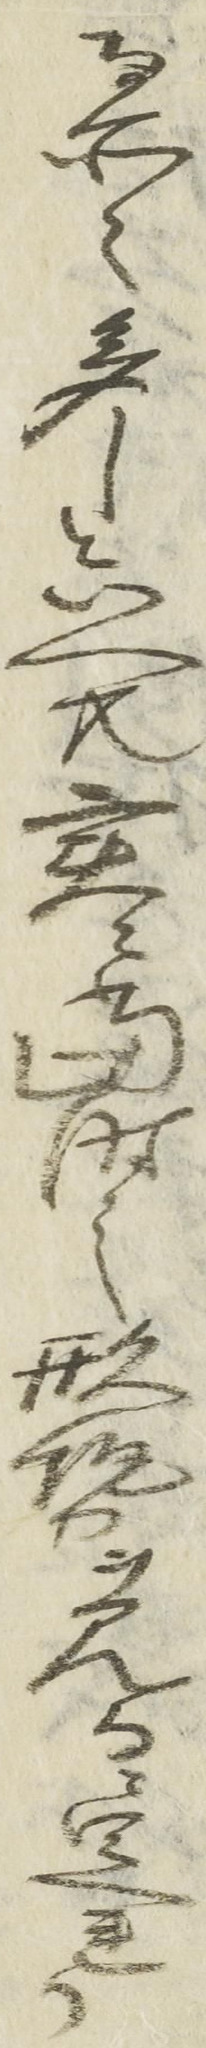る所之多しといへ共実ニ当時之形勢ヲ見るニ足れり
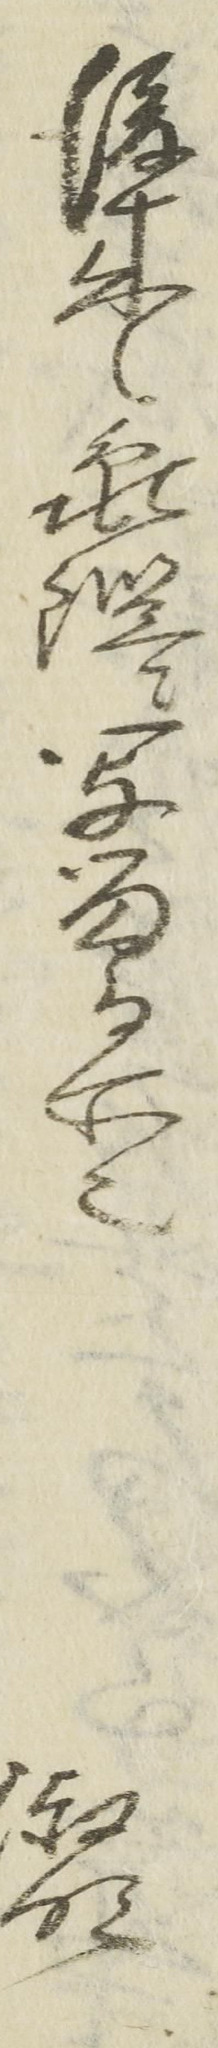後来し亀鑑も写留る所也淑明
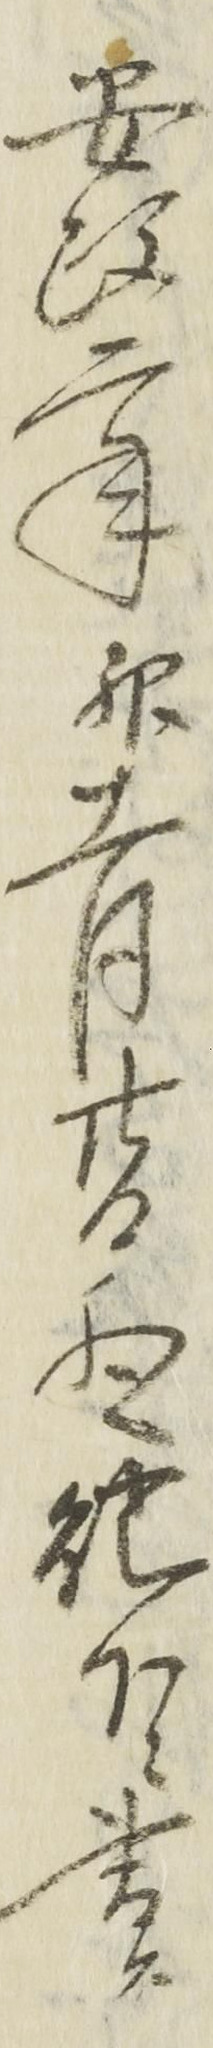安政二年卯十一月は廿日夜燈下ニ書ス
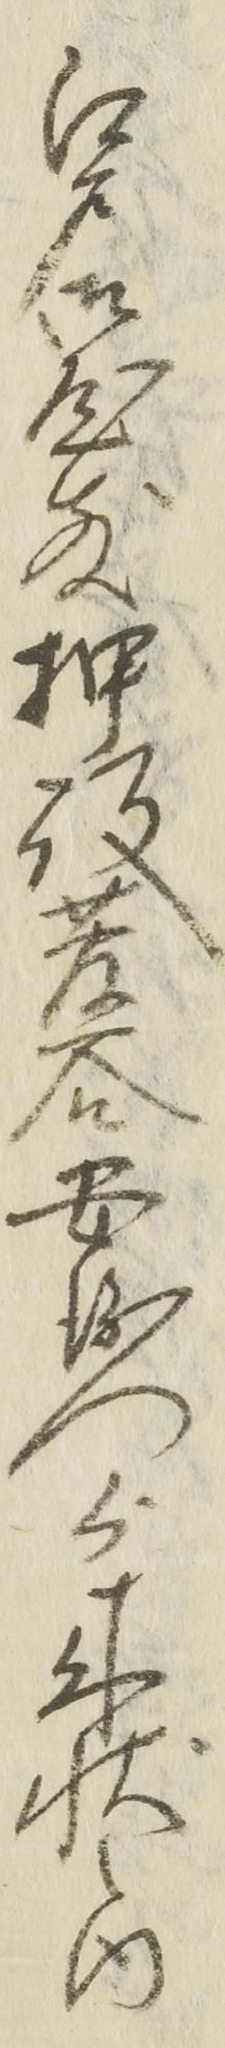江戸御屋敷押役菅谷安衛門ゟ来状之内
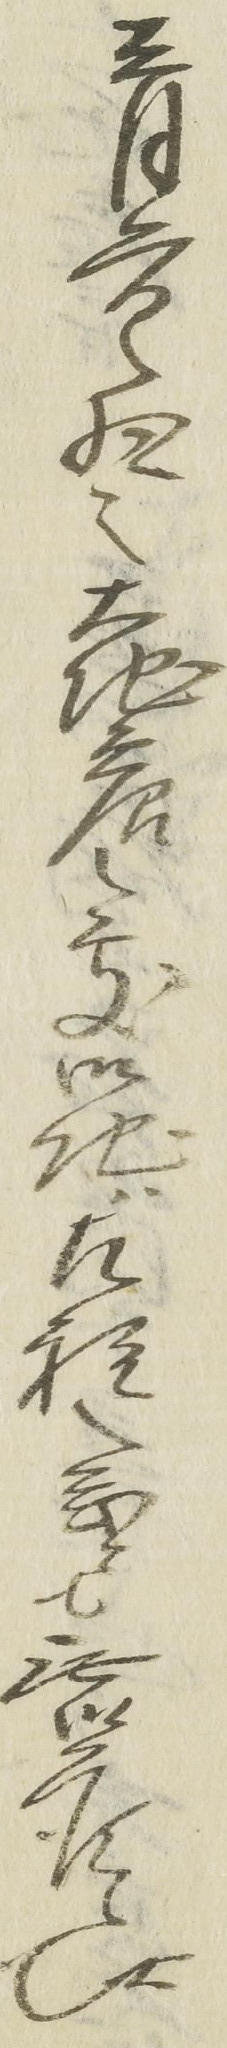三月二日之夜之大地震之処御地ハ左程之義ニも無御座候趣
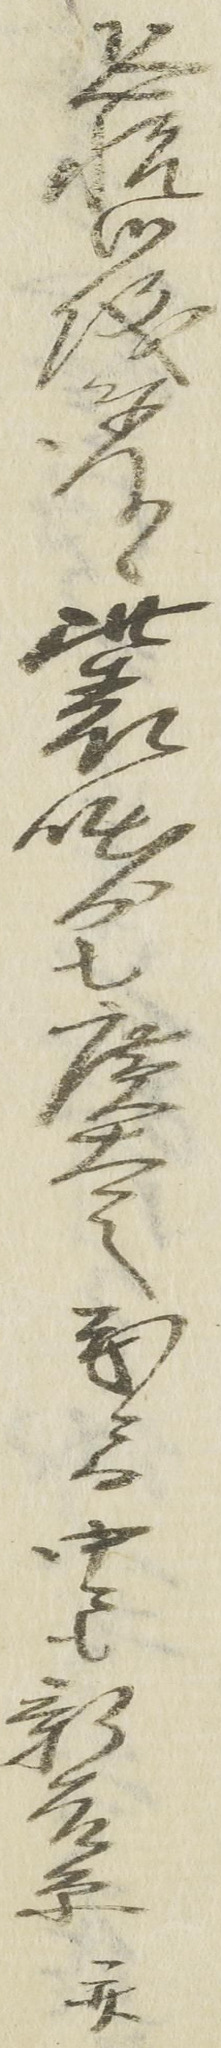恐悦御儀奉存候此表咄ゟも広太之義ニ而中ニも新吉原幷
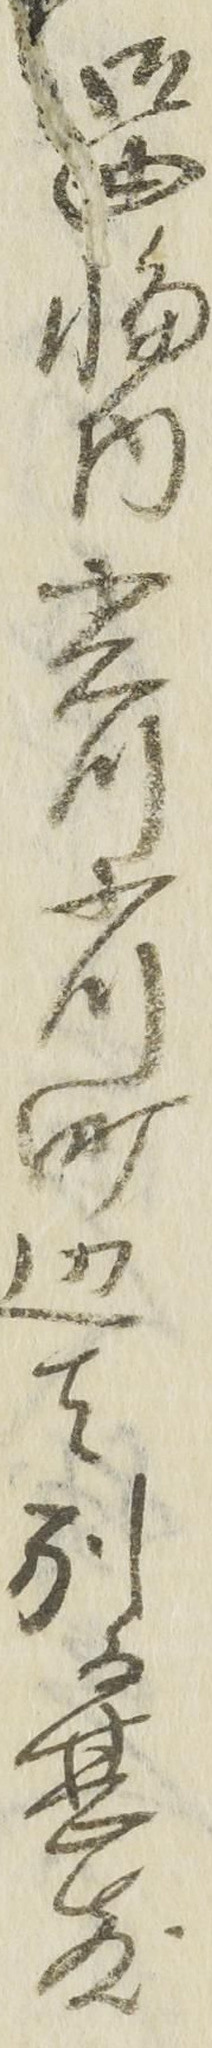御曲輪内小石川小川町辺は別而甚敷
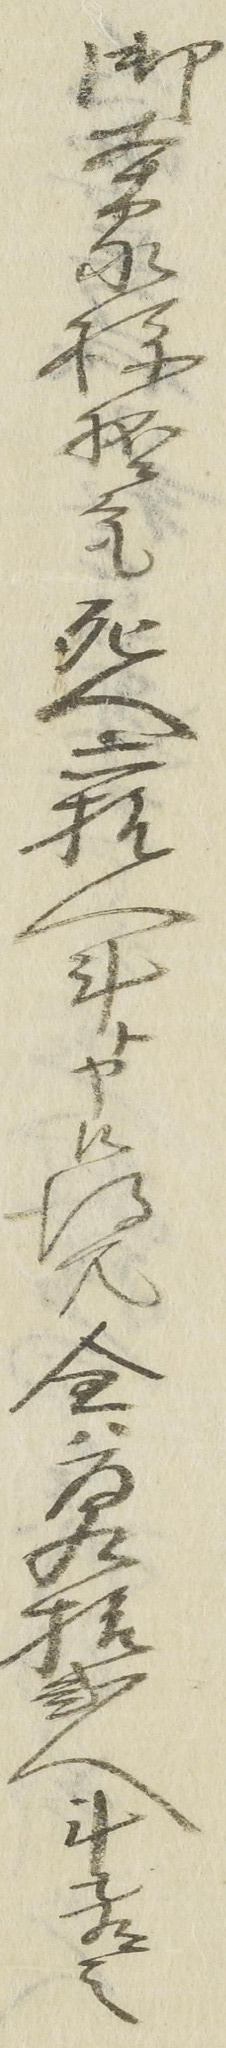御本家様抔ニも死人六拾人計と申候得共全ハ百九拾弐人斗モ有之
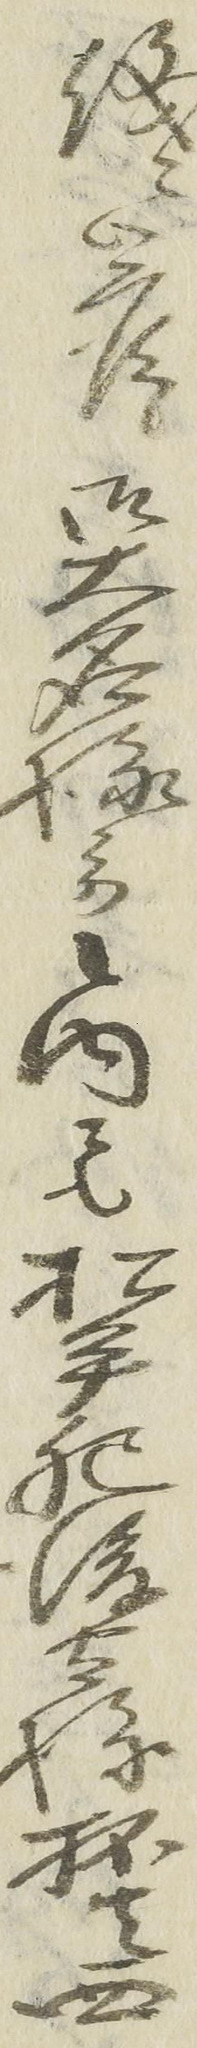儀ニ御座候御大名様方之内ニも松平肥後守抔は西
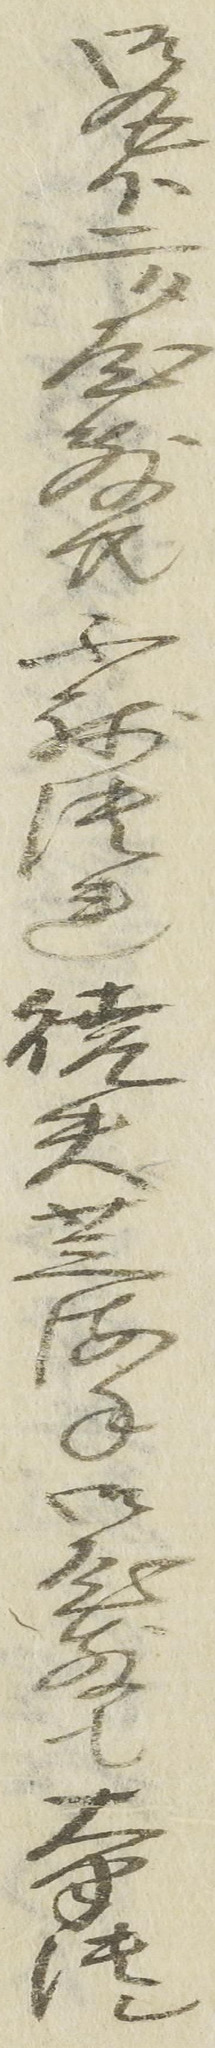御丸下二タ屋敷共不残潰れ焼失芝海手御屋敷も大半潰レ
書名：安政乙卯江戸大地震筆記　安政丙辰八月大阪大雷雨之記追加　安政三辰年七月松前辺大地震并八月大風雨記録
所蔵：東京大学地震研究所図書室 Earthquake Research Institute Library, The University of Tokyo, JAPAN
